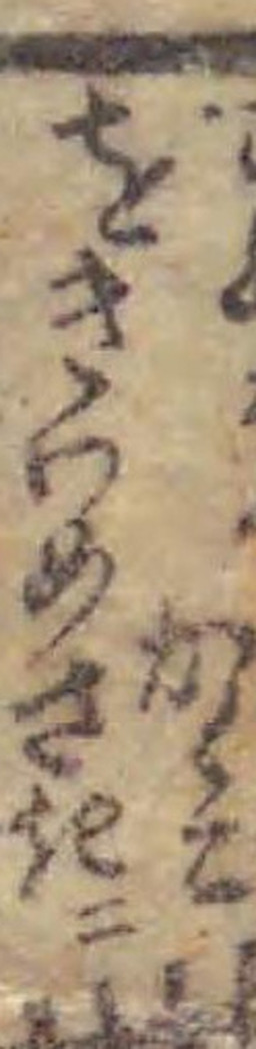をきわめさきに
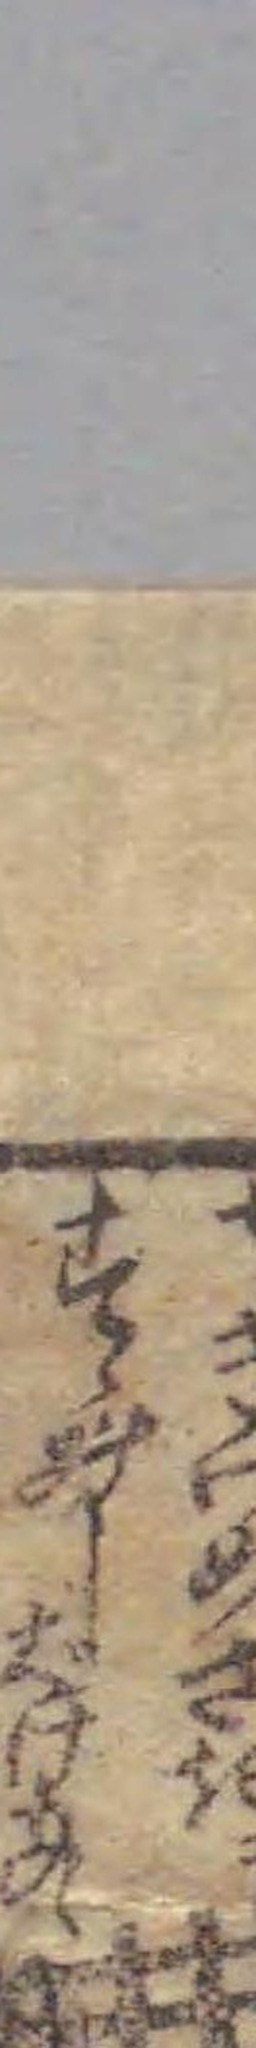すゝみしばけものゝ
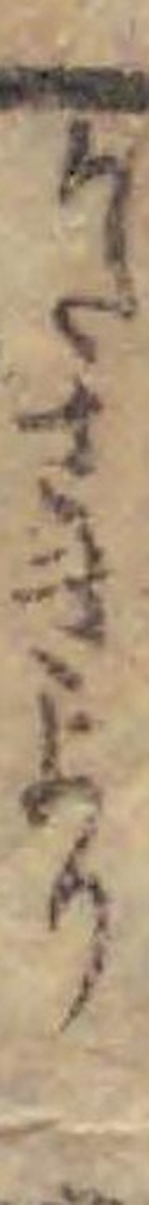かたさきより
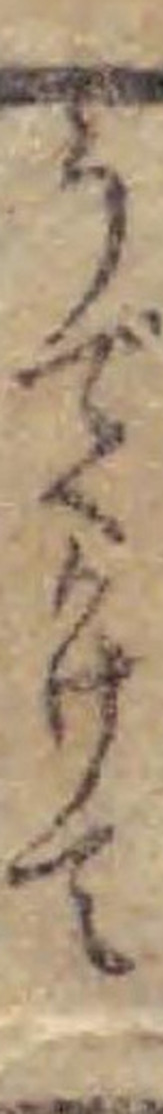うでへかけて
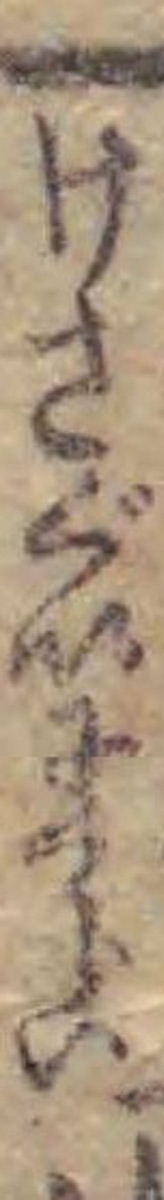けさぐいにくらい
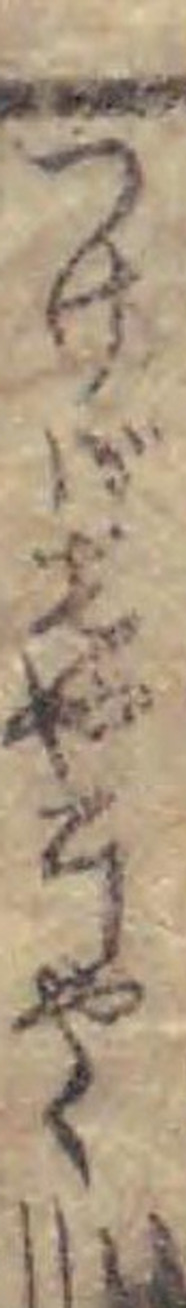つけばしやこしやく
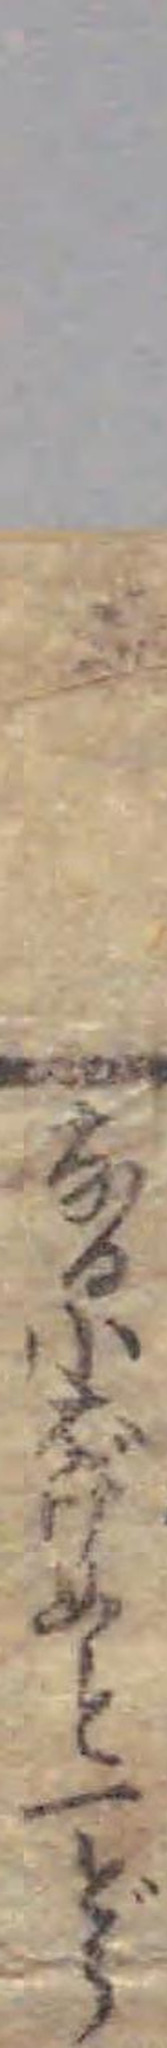なる小ばけめと一どう
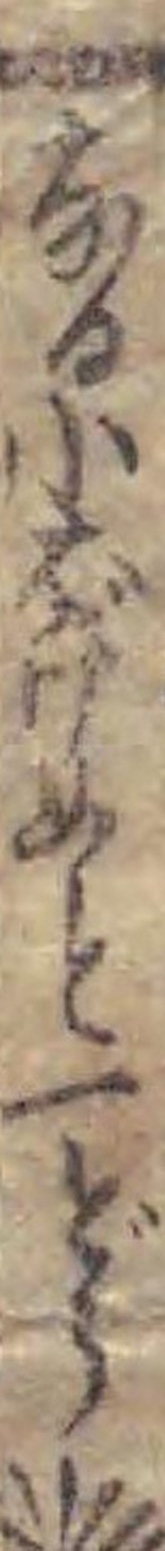なる小ばけめと一どう
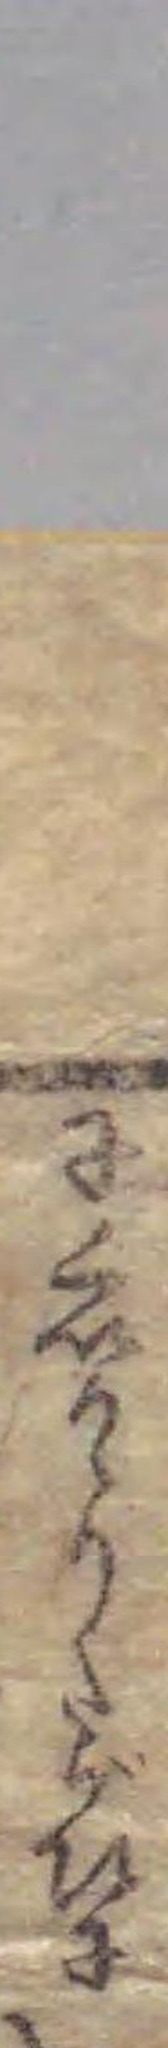にくいかゝりたがひに
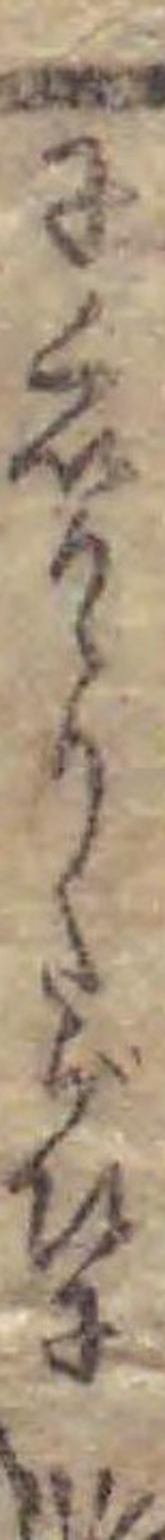にくいかゝりたがひに
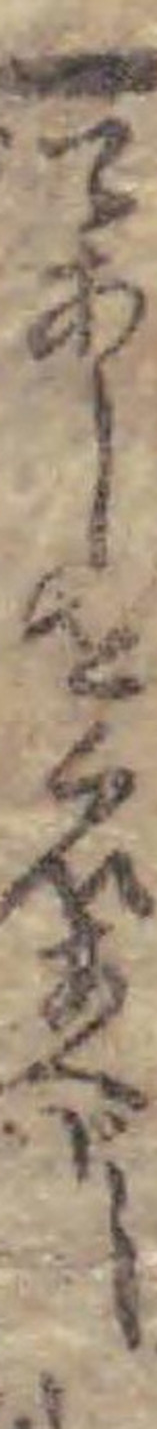てあしをくいあへば
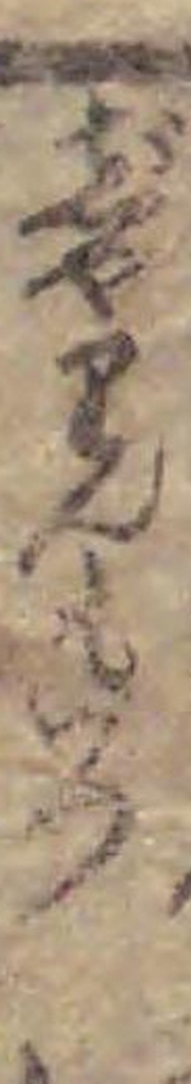じやりんもいつ
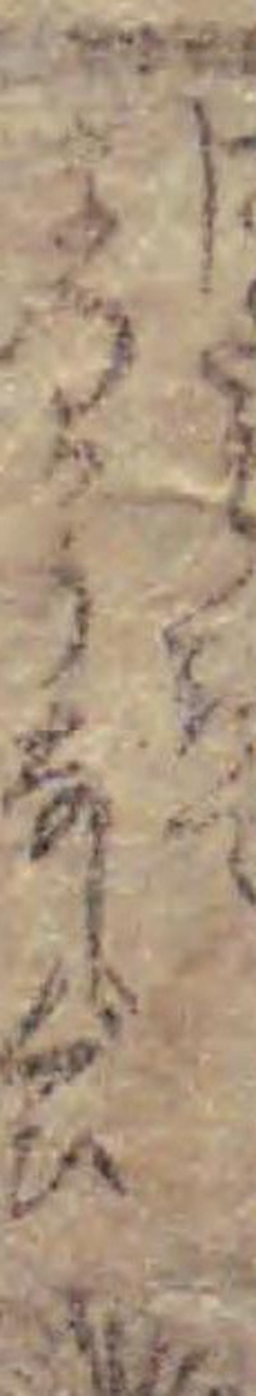まつかうなしぐひ
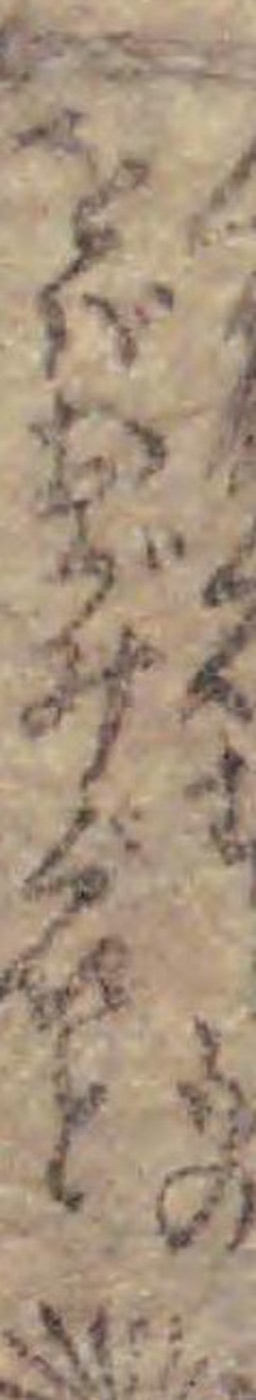をばおがみぐいと
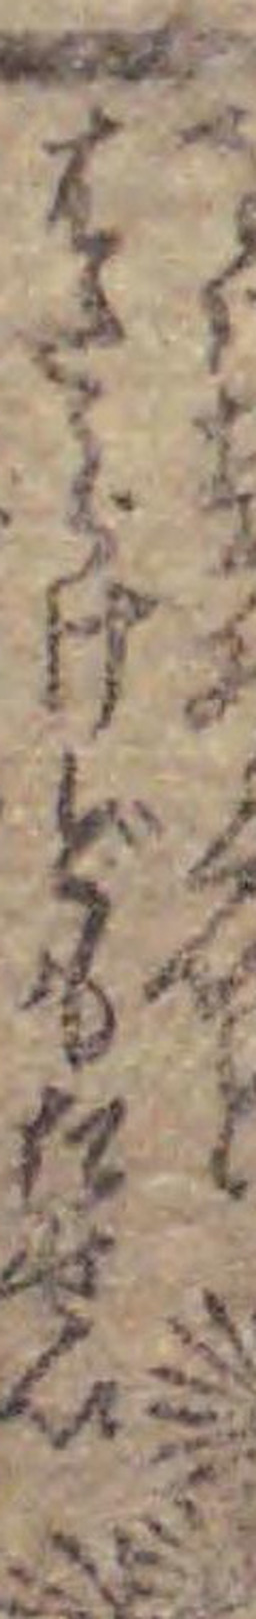はたらけどもたせい
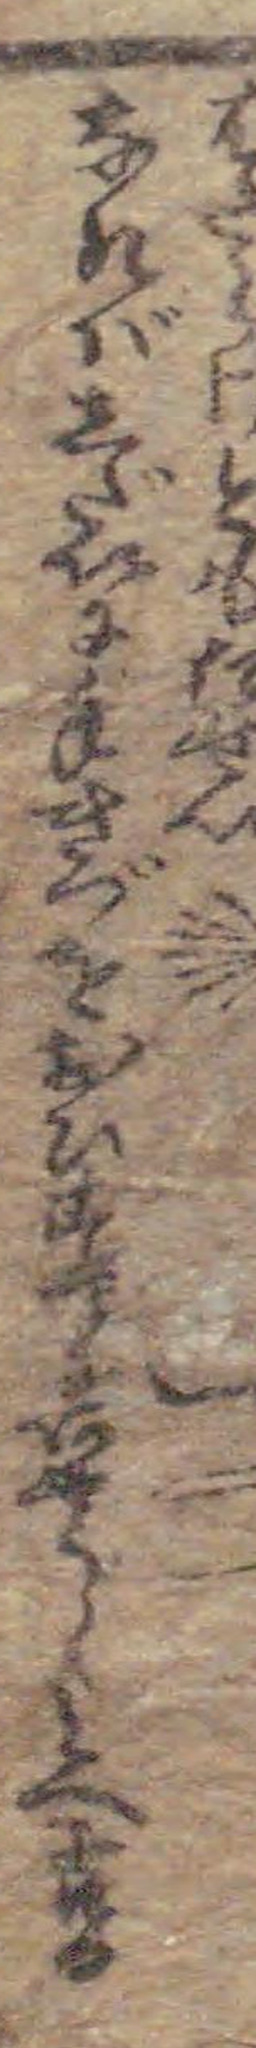なればしだいに手きづをおひすてにあやうしとへにける
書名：化物世界夜半嵐 : 3巻
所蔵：国立国会図書館 National Diet Library, JAPAN
